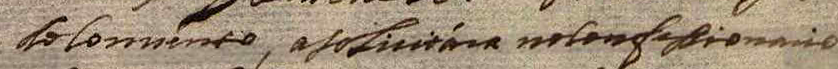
do Conuento, a solicitára no confessionario
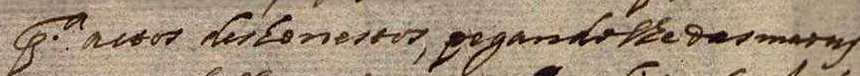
p.a actos deshonestos, pegandolhe das maons
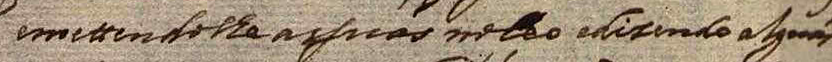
e mettendolhe as suas no ceo e dizendo alguās
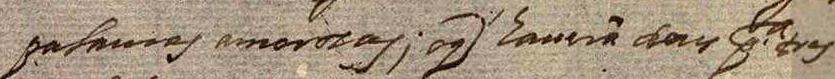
palauras amorozas; o q̄ hauerà dous p.a tres
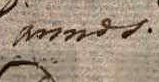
annos.
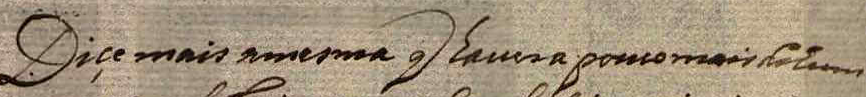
Dice mais a mesma q̄ hauera pouco mais de hum
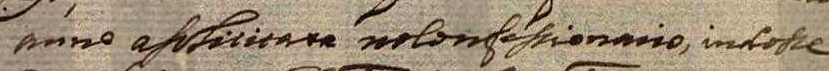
anno a solicitara no confessionario, indosse
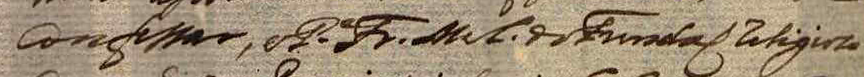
confessar, o P.e Fr. Mel. do Fundaꝭ Religiozo
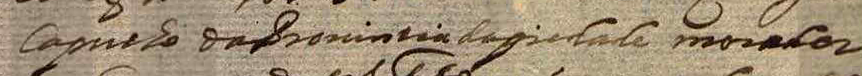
Capucho da Prouincia da piedade morador
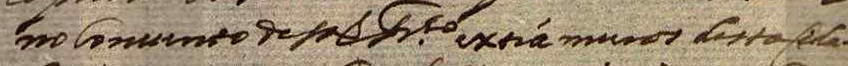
no Conuento de saõ Fr.co extrá muros desta Cida
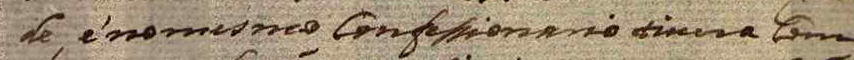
de, e no mesmo confessionario tiuera com
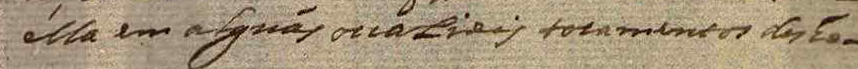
ella em alguās occaziois tocamentos desho
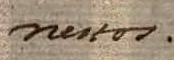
nestos.
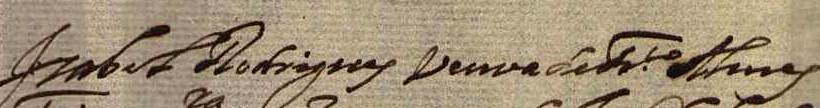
Jzabel Rodrigues veuva de Fr.co Alures
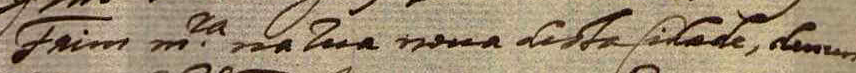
Faim m.ra na Rua noua desta Cidade, denun
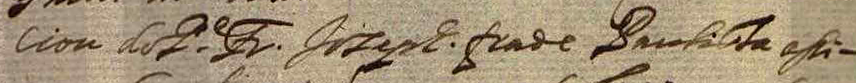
ciou do P.e Fr. Jozeph. frade Paulista assi
